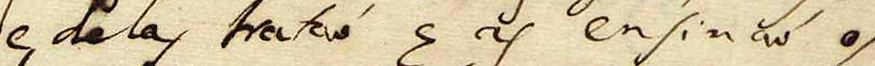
e delas trataõ E as ensinaõ os
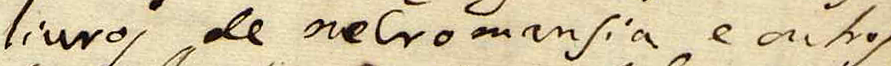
liuros de necromansia, e outros
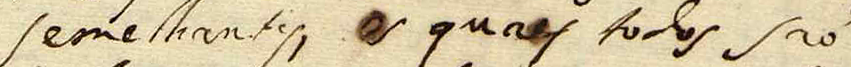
semelhantes, os quaes todos saõ
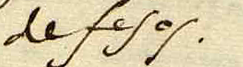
defesos.
